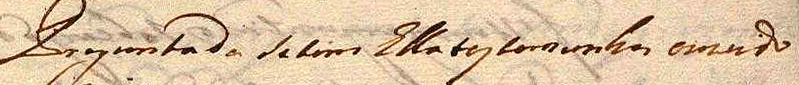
Preguntada se tem Ella testemunha ouuido
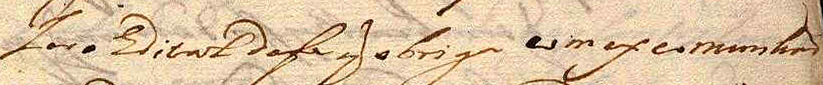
Ler o Edital de fe q̄ obriga com excomunhaõ
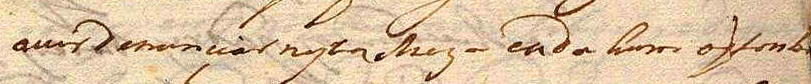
a uir denunciar nesta Meza cada hum o q̄ soub
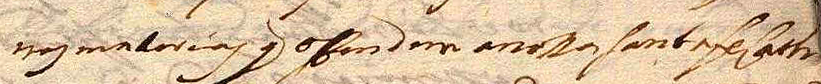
nas materias q̄ offendem a nossa santa fe Catho
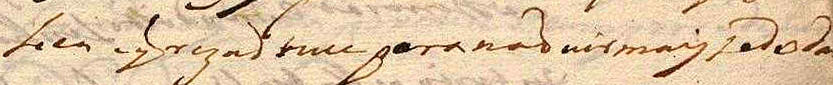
Lica e q̄ rezaõ teue pera naõ uir mais sedo da
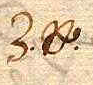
3. tto.
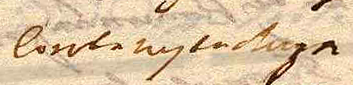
conta nesta Meza
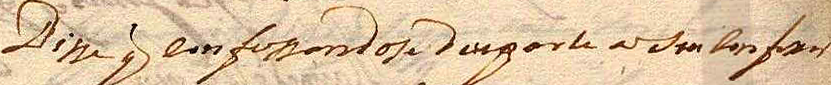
Disse q̄ confessandose deu parte ao seu confessor
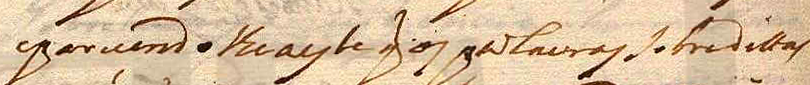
e parecendolhe a este q̄ as palauras sobredittas
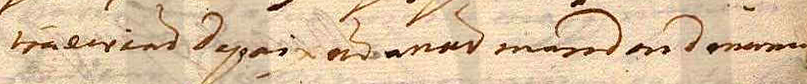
erã e criaõ de paixaõ a não mandou denunci
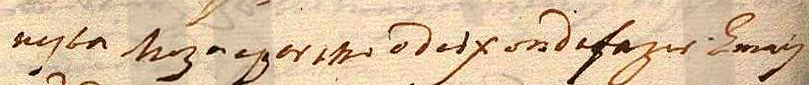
nesta Meza e por isso o deixou de fazer. E mais
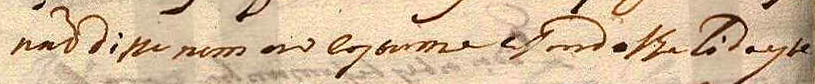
naõ disse nem no costume e sendolhe lida este
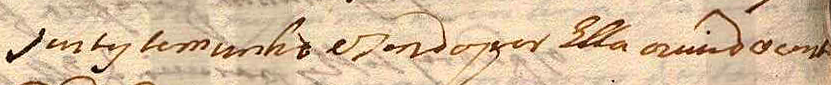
seu testemunho e sendo por Ella ouuido e en
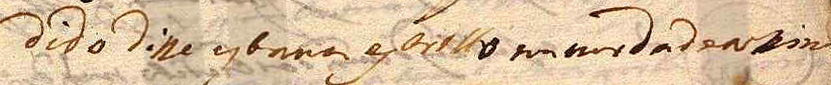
dido disse estaua escritto na uerdade assin
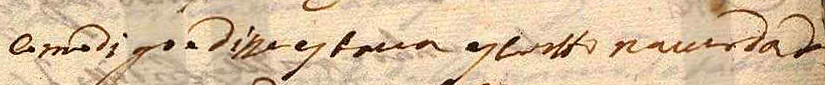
como digo e disse estaua escritto na uerdade
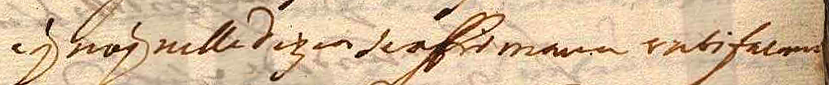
e q̄ no q̄ nelle dizia se affirmaua ratificaua
